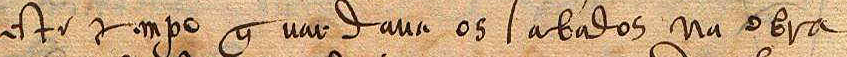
este tempo guardaua os sabados na obra
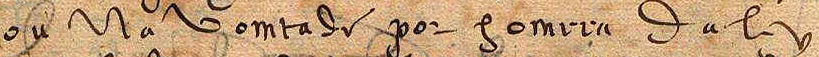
ou Na Vomtade por homrra da ley
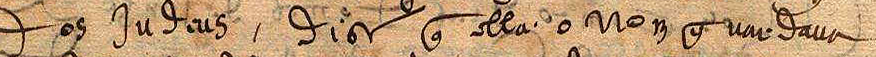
dos Judeus / dise q̄ ella o nom guardaua
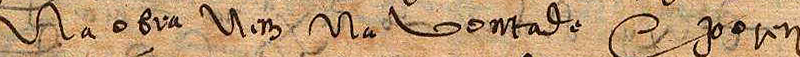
Na obra Nem Na Vontade e poren
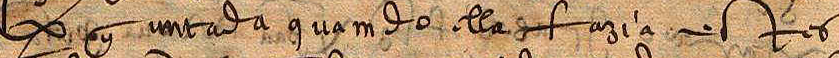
ꝑgumtada quamdo ella fazia estes
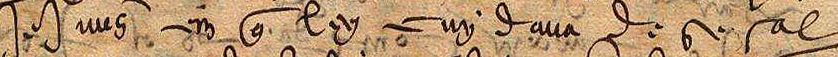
JeJuus̄ em q̄ ley cuydaua de se sal
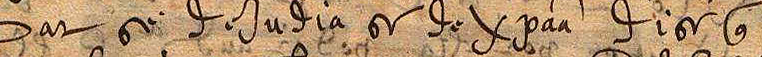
Var se de Judia se de xpaā dise q̄
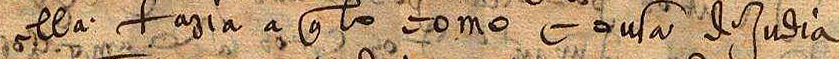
ella fazia aq̄lo como cousa de Judia
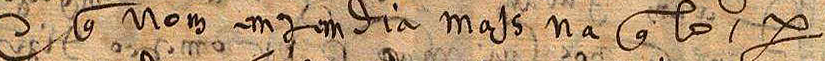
e q̄ nom emtemdia majs naq̄lo / ꝑ
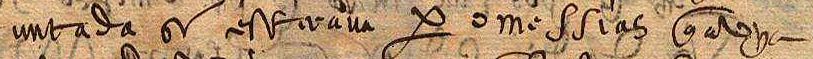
guntada se esperaua ꝑ o messias q̄ avya
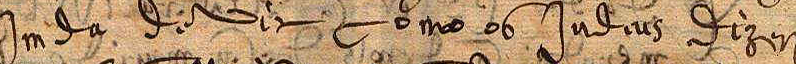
aJmda de vir como os Judeus dizen
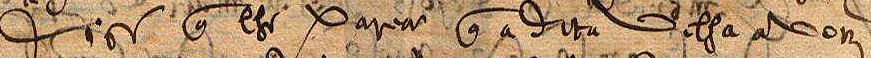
dose q̄ lhe parece q̄ a dita Velha avom
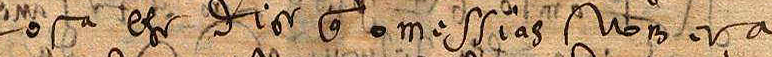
dosa lhe dise q̄ o messias nom era
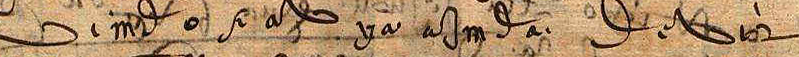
Vimdo e avya aJmda de vir
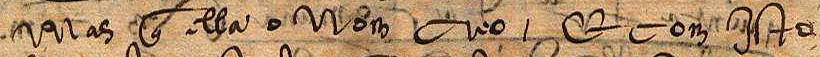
mas q̄ ella o Nom creo / E com Jsto
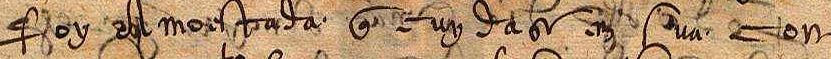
foy Amoestada q̄ cuydase em sua com
